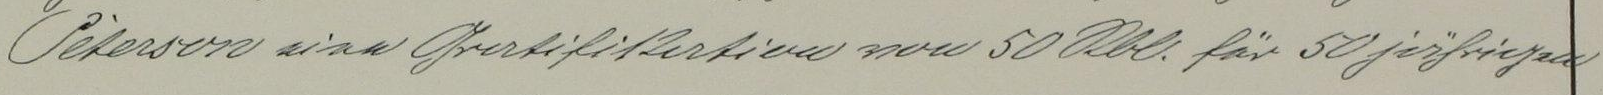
Peterson eine Gratifikation von 50 Rbl. für 50jährigen
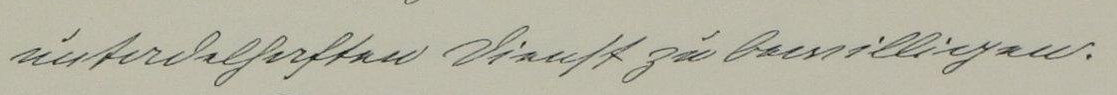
untadelhaften Dienst zu bewilligen.
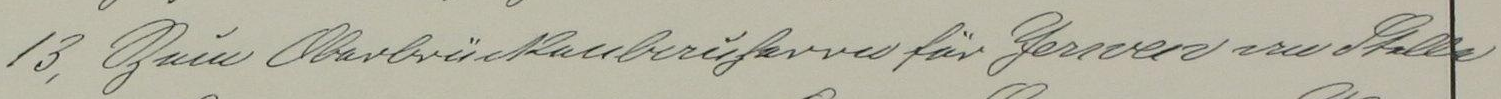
13. Zum Oberbrückenbauherrn für Jerwen an Stelle
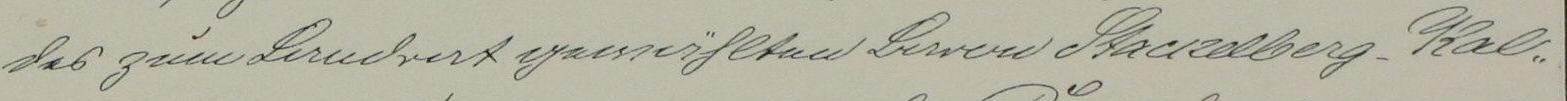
des zum Landrat gewählten Baron Stackelberg-Kal-
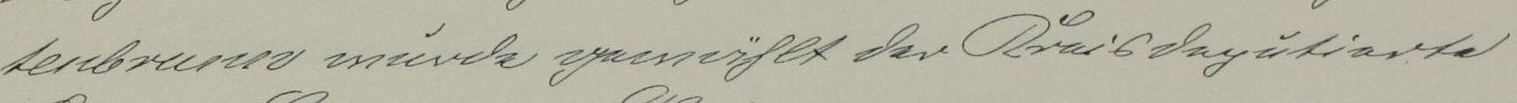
tenbrunn wurde gewählt der Kreisdeputierte
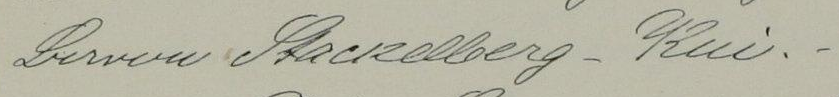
Baron Stackelberg-Kui.
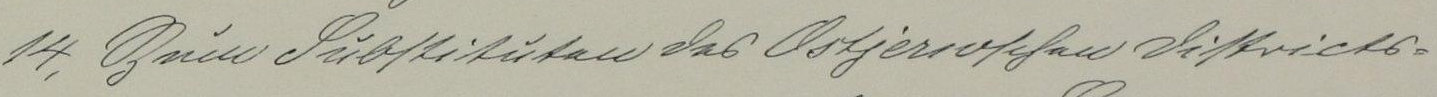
14. Zum Substituten des Ostjerwschen Districts-
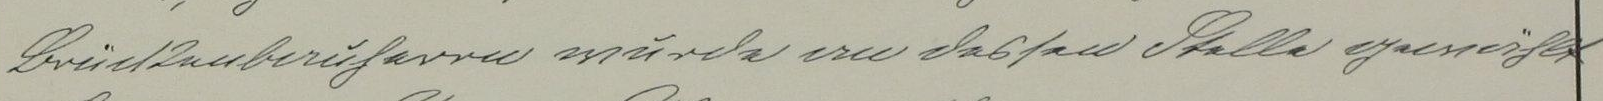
Brückenbauherrn wurde an dessen Stelle gewählt
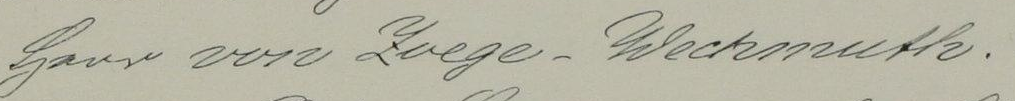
Herr von Zoege-Wechmuth.
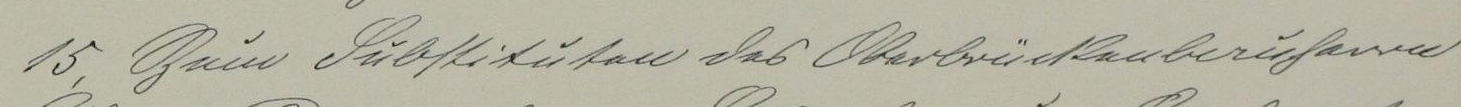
15. Zum Substituten des Oberbrückenbauherrn
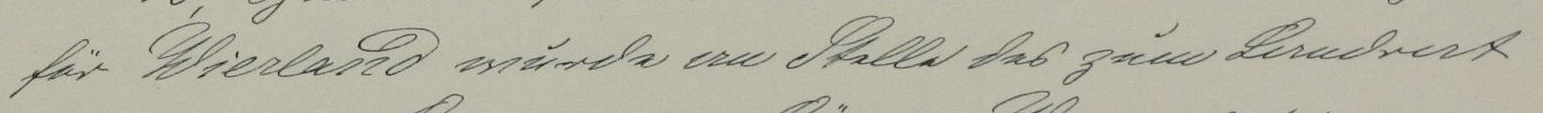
für Wierland wurde an Stelle des zum Landrat
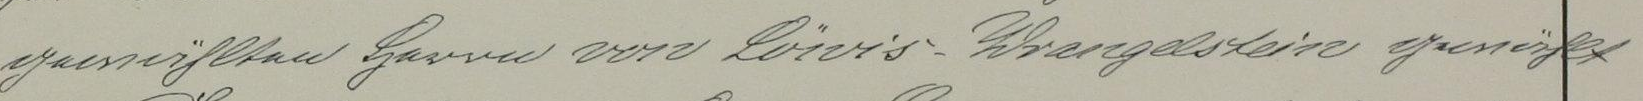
gewählten Herrn von Löwis-Wrangelstein gewählt
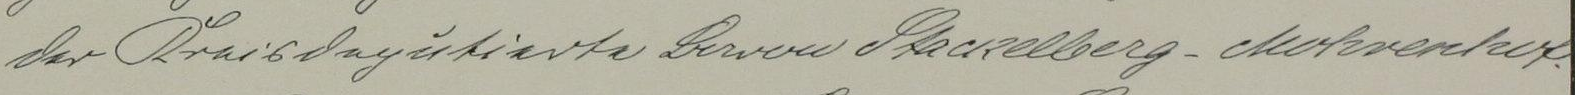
der Kreisdeputierte Baron Stackelberg-Mohrenhof.
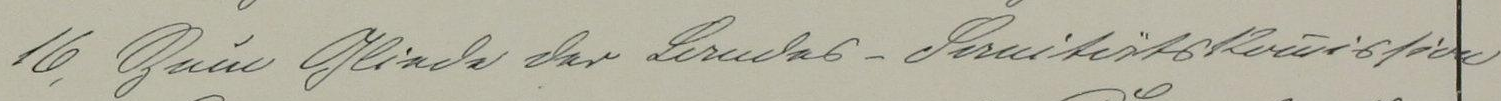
16. Zum Gliede der Landes-Sanitätskommission
